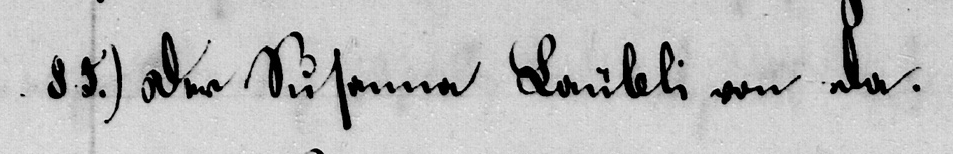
85.) Der Susanna Läubli von da.
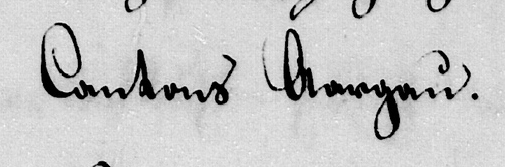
Cantons Aargau.
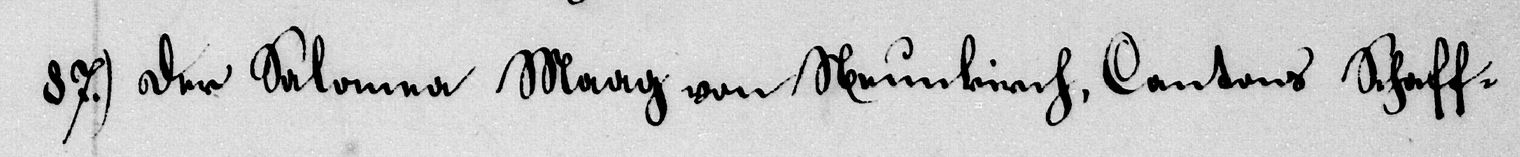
87.) Der Salomea Maag von Neunkirch, Cantons Schaff¬
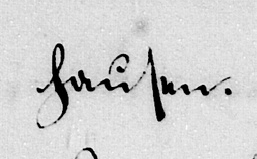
hausen.
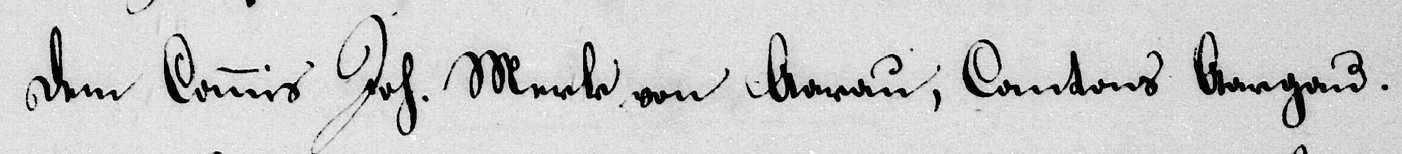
Dem Commis Joh. Merk von Aarau, Cantons Aargau.
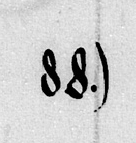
89.)
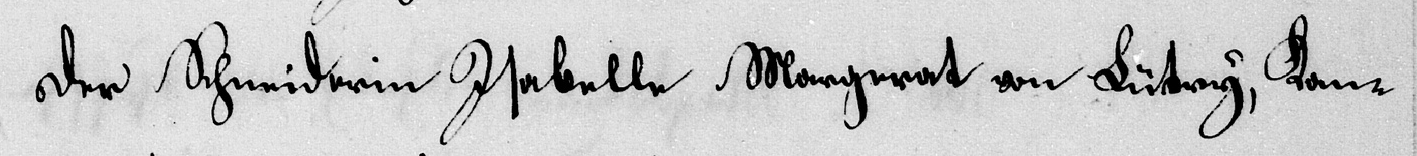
Der Schneiderin Isabelle Margerat von Lütry, Kan¬
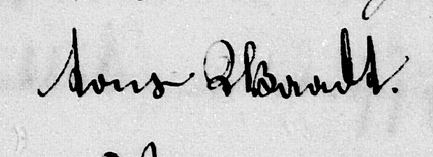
tons Waadt.
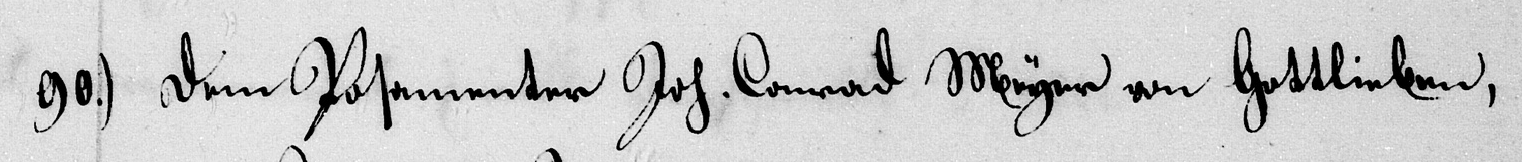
90.) Dem Posamenter Joh. Conrad Meyer von Gottlieben,
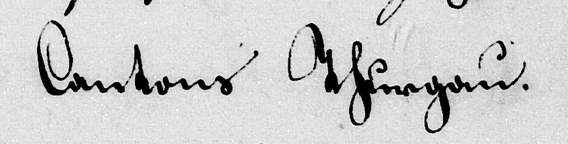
Cantons Thurgau.
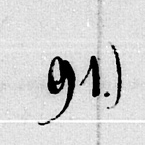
91.)
